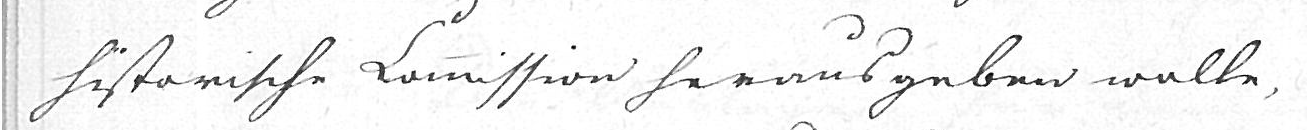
historische Commission herausgeben wolle,
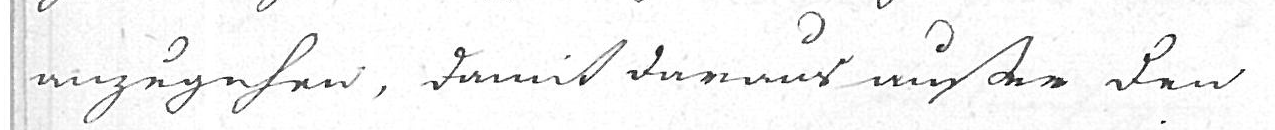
anzugehen, damit daraus außer den
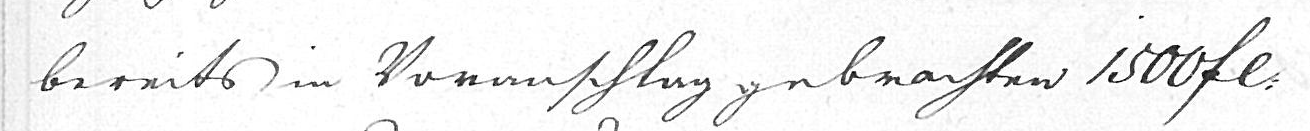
bereits in Voranschlag gebrachten 1500 fl.
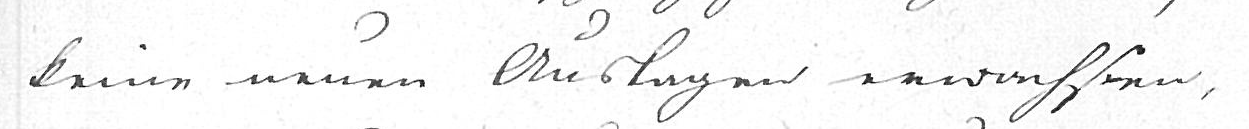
keine neuen Auslagen erwachsen,
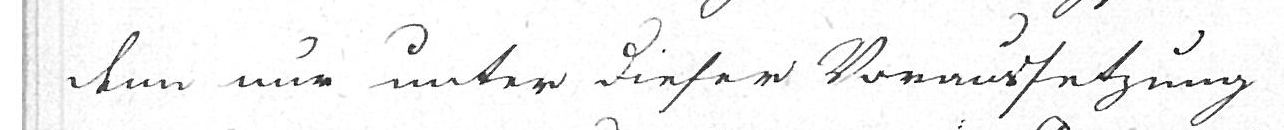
denn nur unter dieser Voraussetzung
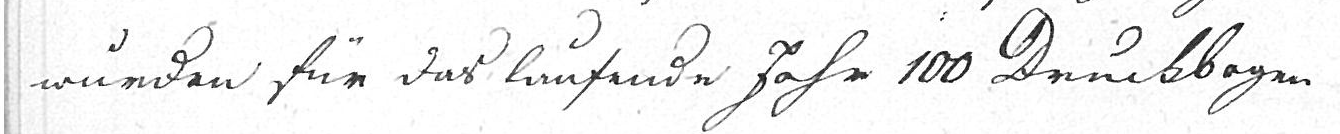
wurden für das laufende Jahr 100 Druckbogen
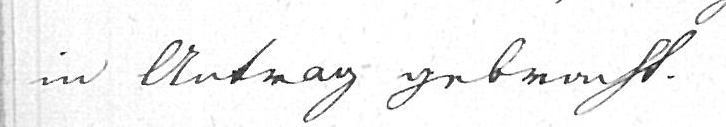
in Antrag gebracht.
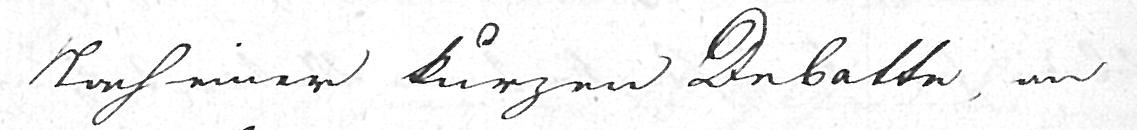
Nach einer kurzen Debatte, an
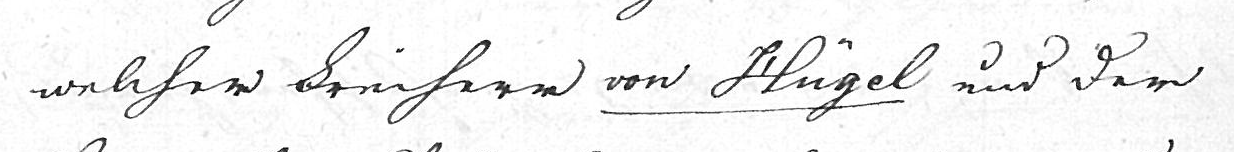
welcher Freiherr von Hügel und der
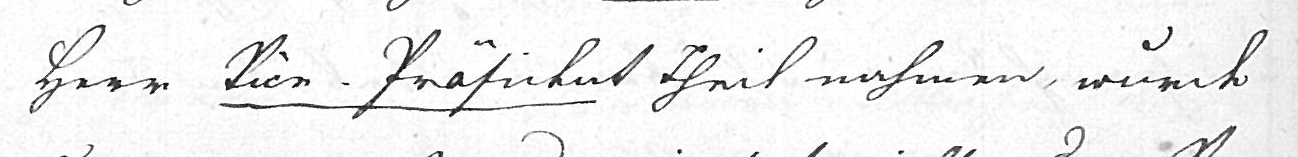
Herr Vice-Präsident Theil nahmen, wurde
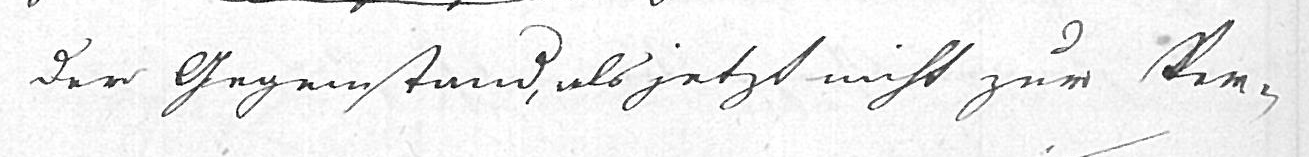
der Gegenstand, als jetzt nicht zur Ver-
